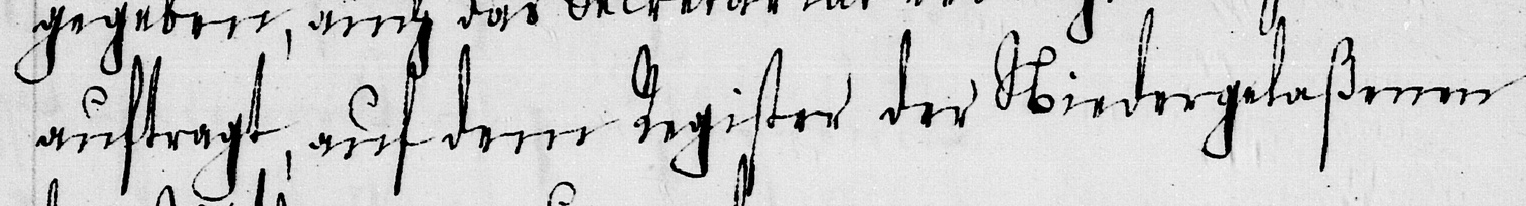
auftragt, auf dem Register der Niedergelaßenen
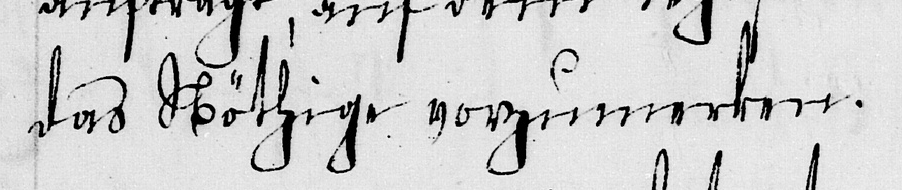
das Nöthige vorzumerken.
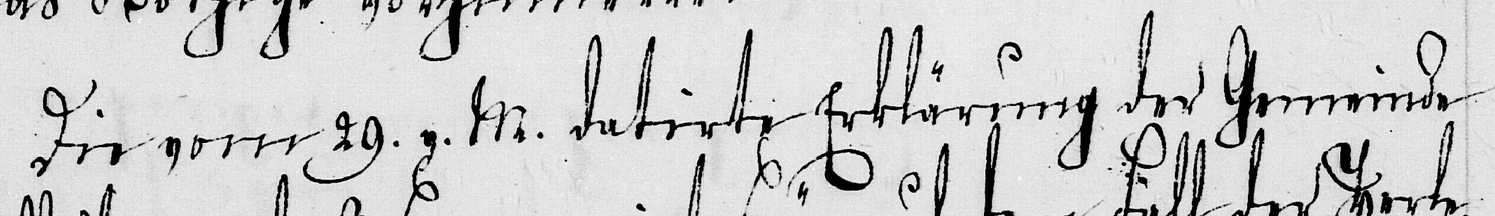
Die vom 29. v. M. datirte Erklärung der Gemeinde
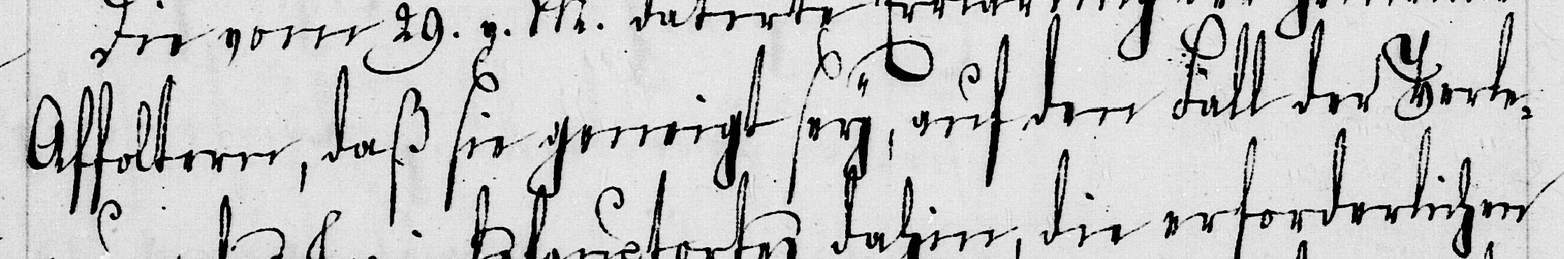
Affoltern, daß sie geneigt sey, auf den Fall der Verle¬
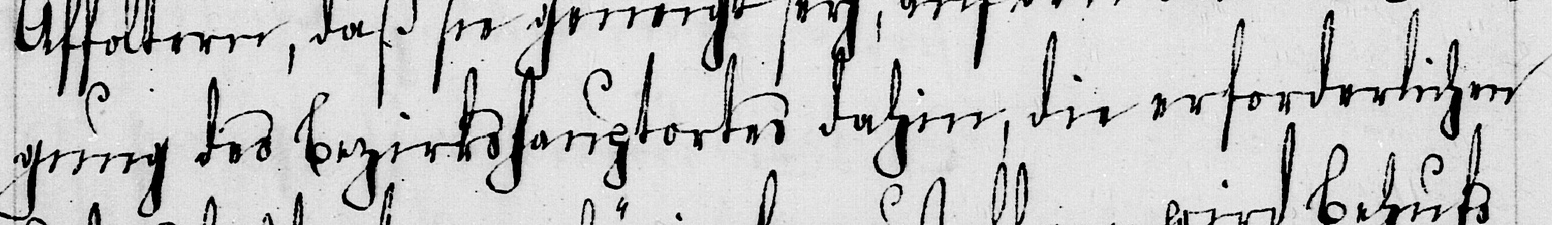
gung des Bezirkshauptortes dahin, die erforderlichen
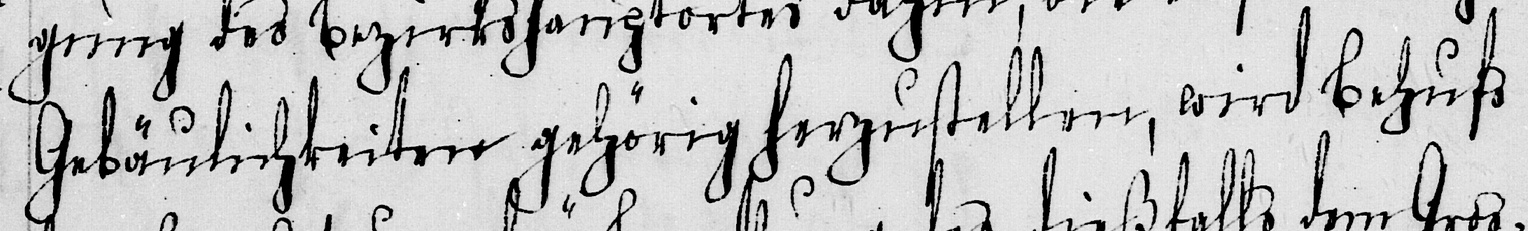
Gebäulichkeiten gehörig herzustellen, wird Behufs
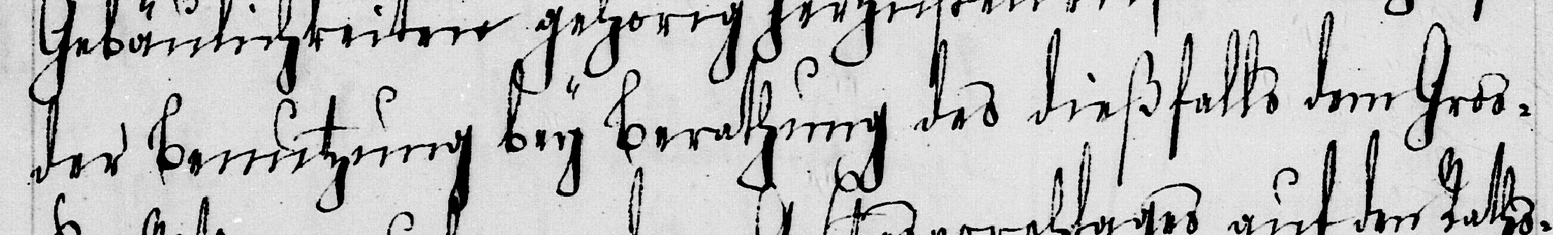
der Benutzung bey Berathung des dießfalls dem Groß¬
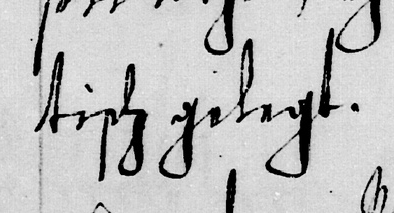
isch gelegt.
